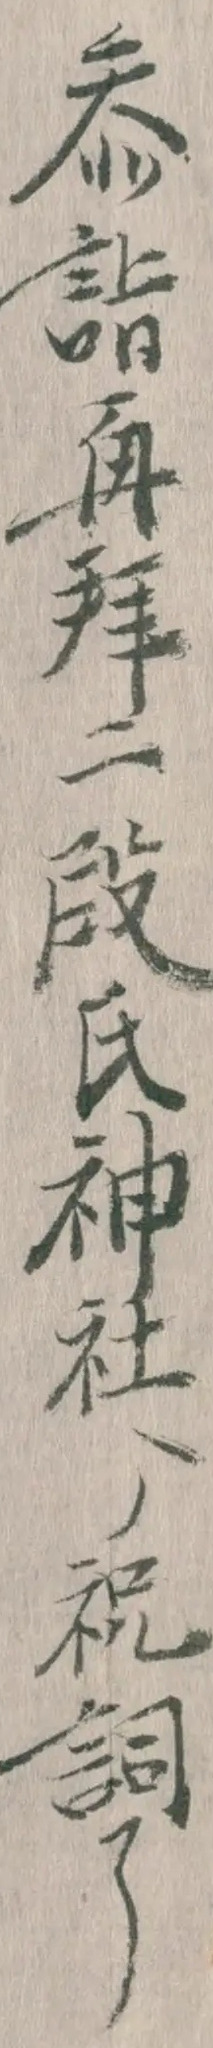参詣再拝二段氏神社へノ祝詞了
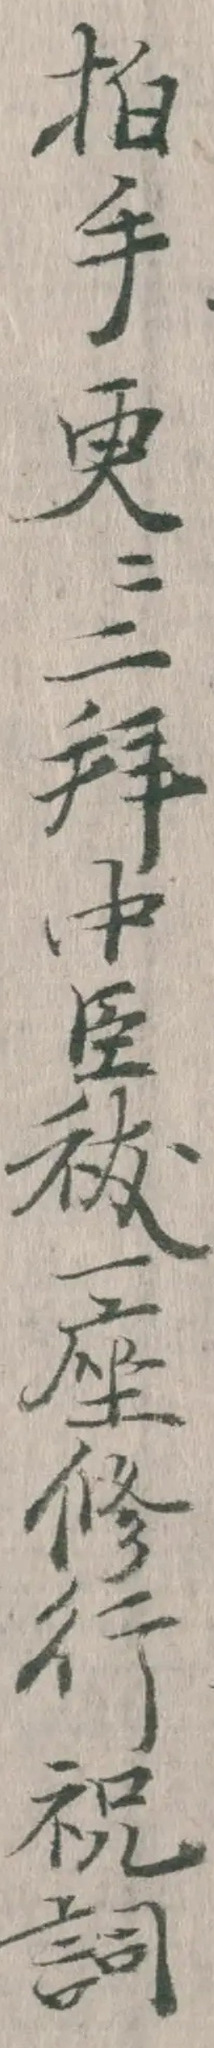狛手更ニ二拝中臣被一座修行祝詞
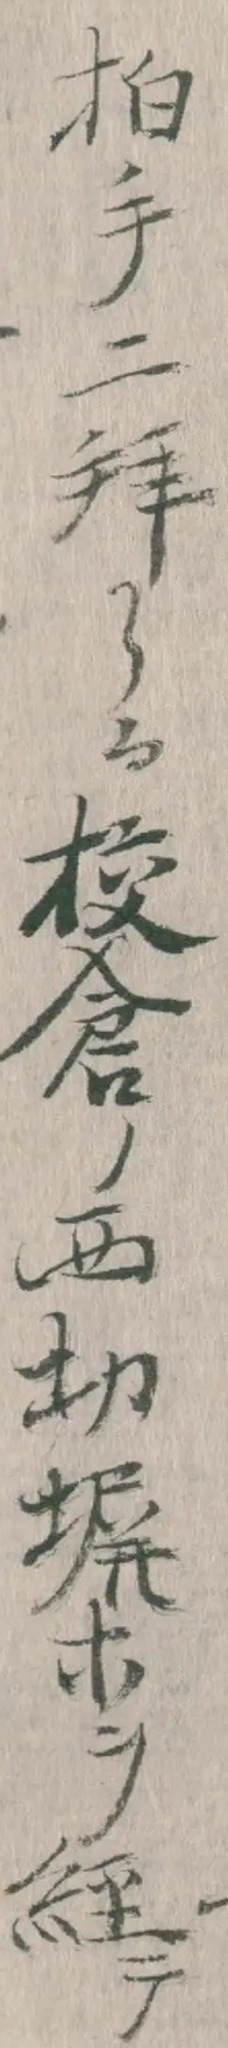拍手二拝了而校倉の西切塀等ヲ経テ
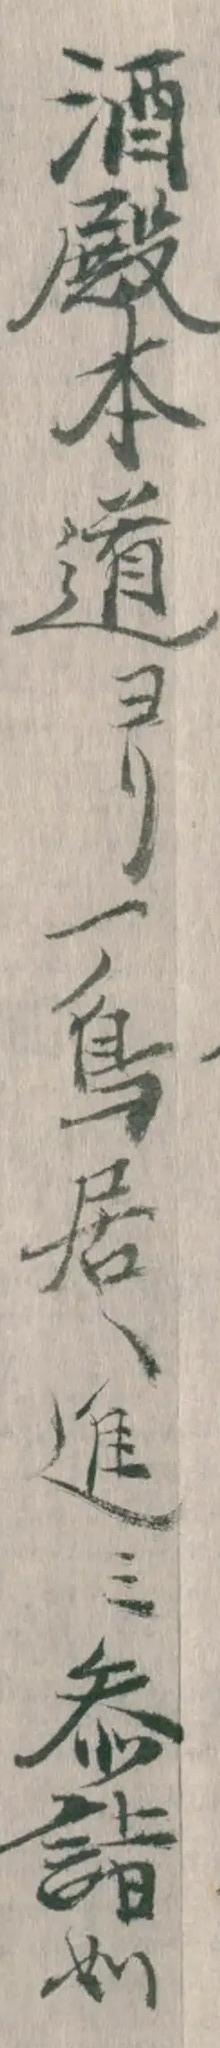酒殿本道ヨリ一鳥居へ進ミ参詣如
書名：賀茂社記録. 第72冊
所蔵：国立国会図書館 National Diet Library, JAPAN
